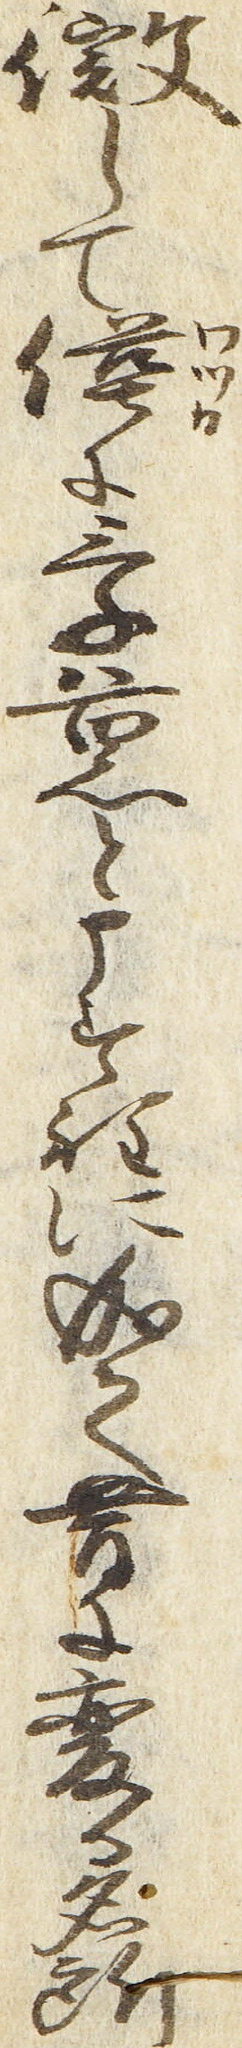微して僅に三千八百石と申す程に成て昔に変る名所

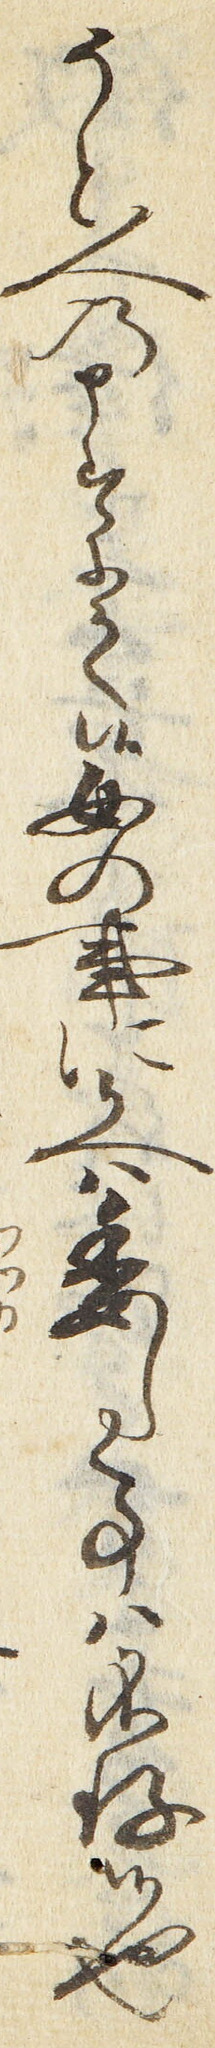そと人の申すにて候女の事に候へは委しく事は不存候也
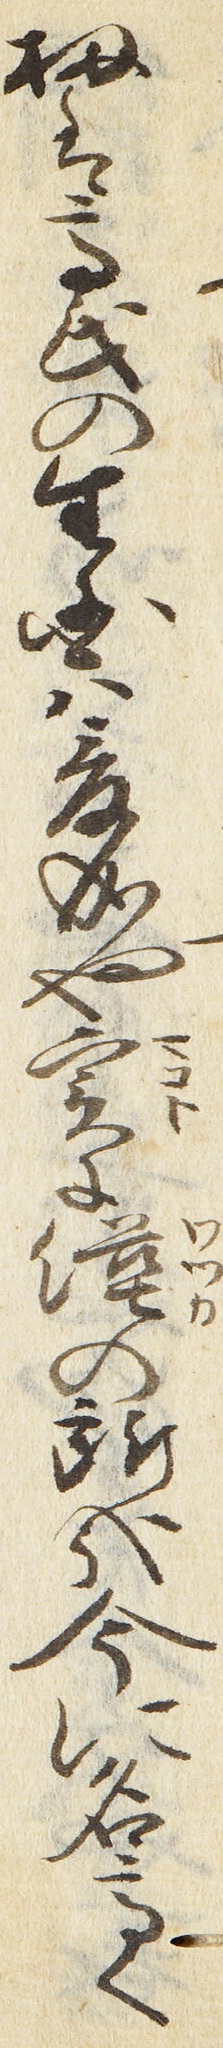扨は高氏の生国は爰成や実に僅の所哉今に名高く
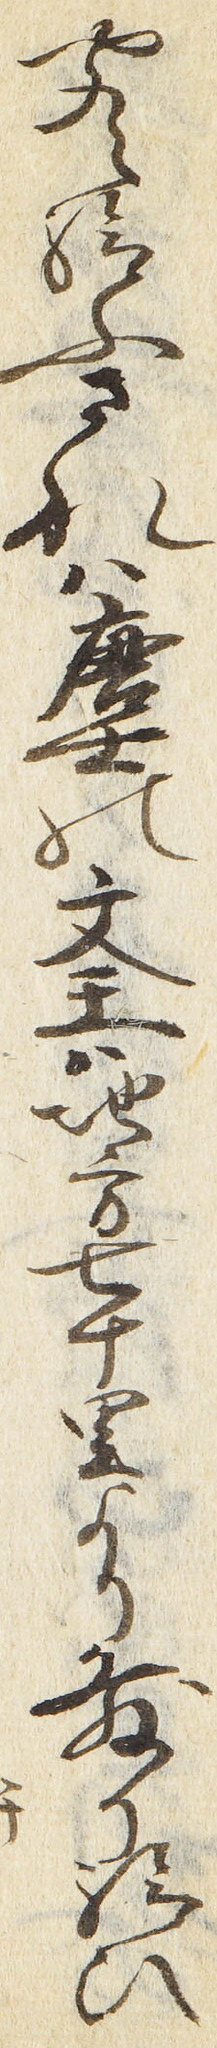聞え給ふされは唐土の文王は地方七十里より発り給ひ
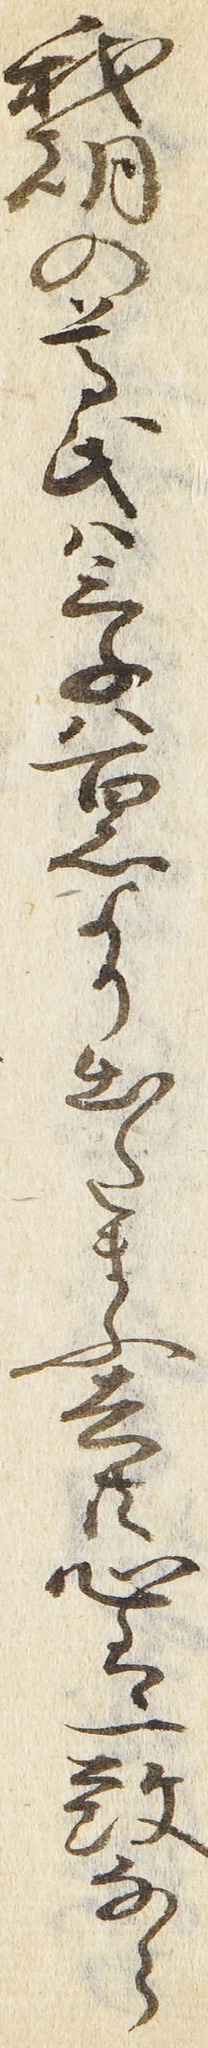我朝の尊氏は三千八百石より出たまふ去共心は一致なら
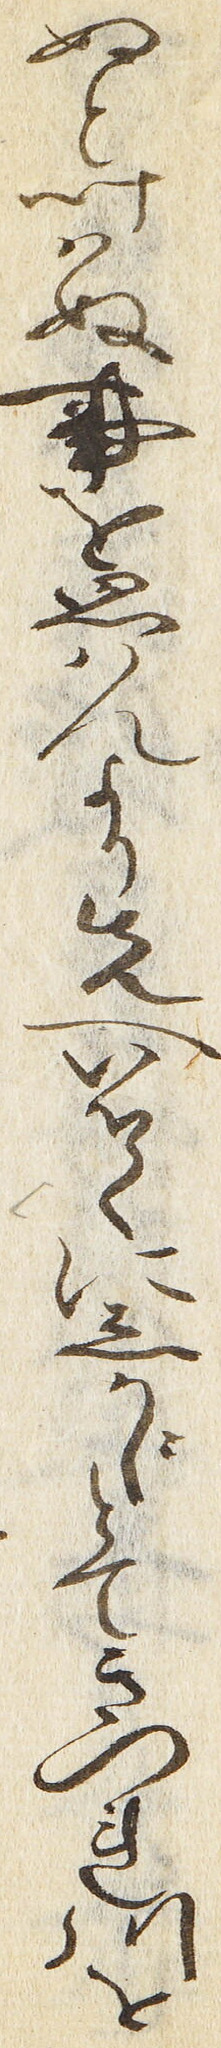ぬと叶はぬ事を思はんより先へいそくにしかじとてきつれ川を
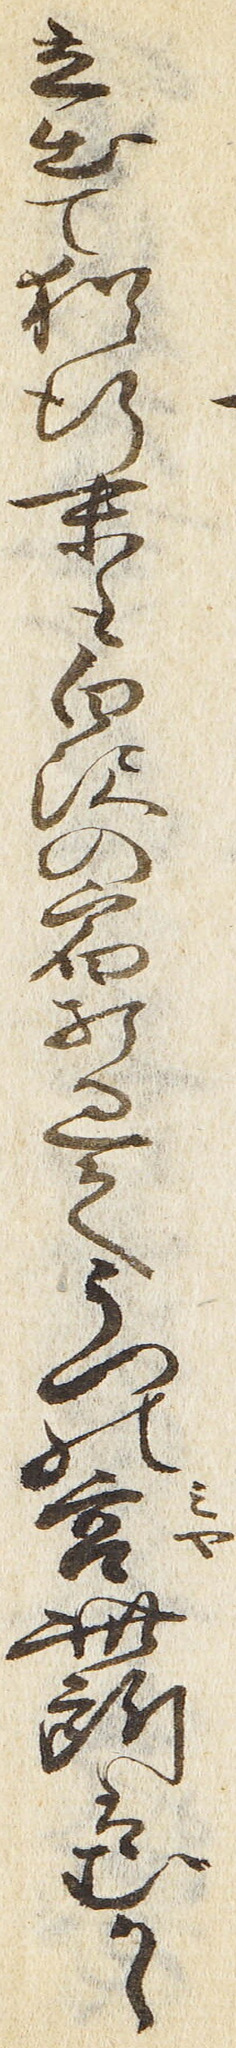立出て猶行末も白沢の宿打過てうつの宮此所はむかし
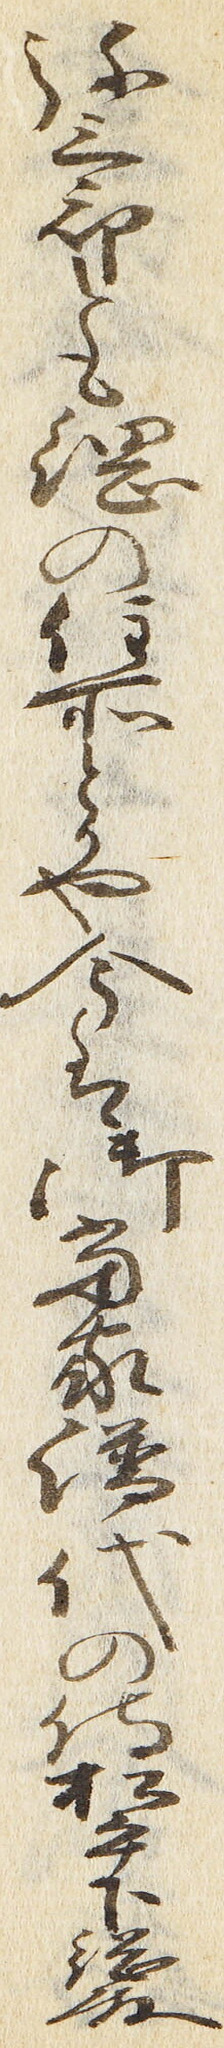弥三郎とも綱の住所とかや今は御当家譜代の侍松平下総殿
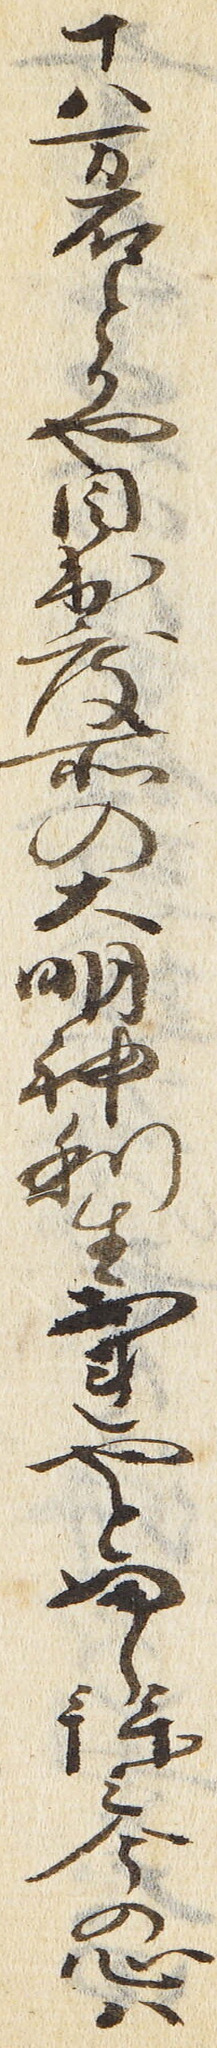十八万石とかや目出度所の大明神利生あれやとふし拝み今の心は
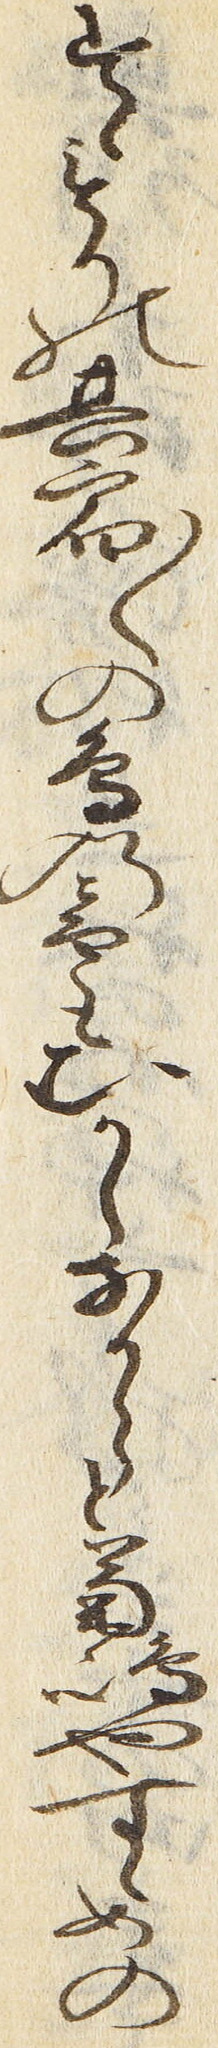すゝもりの其宿〳〵の鳥の音もむかしなからと菊嶋やすゝめの
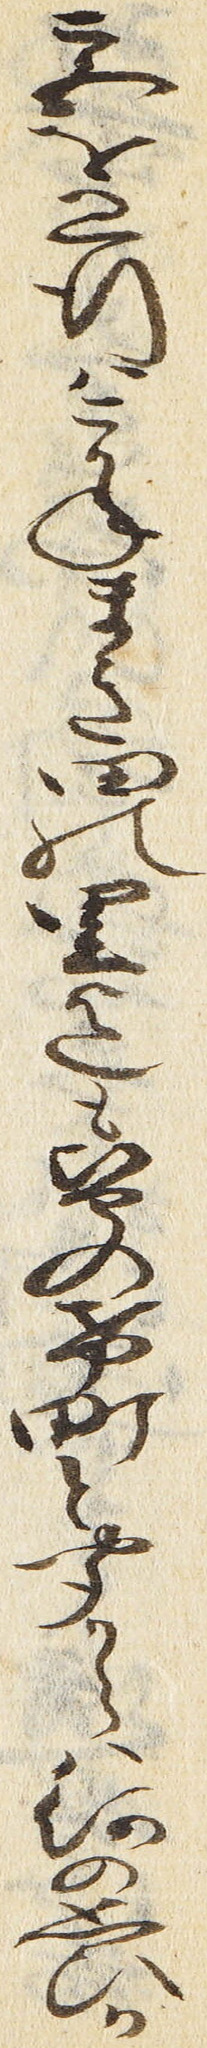宮を過行くはこかねまき田の里迄も皆のけ町と聞からは何の思ひか
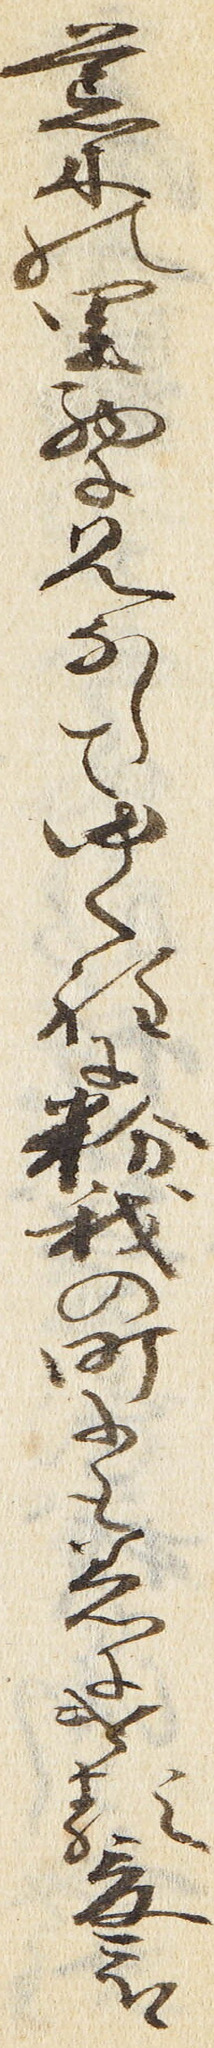荒木の里西に見なしてゆく程に粉我の町にも着にける爰こそ
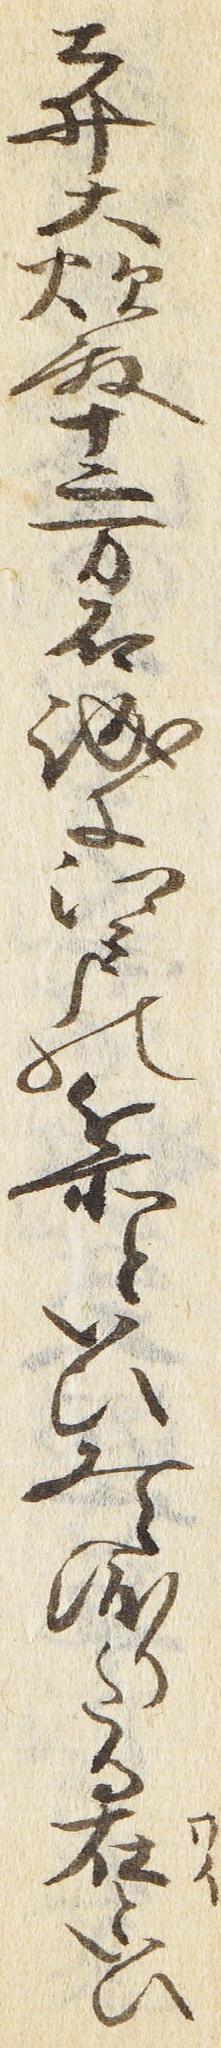土井大炊殿十二万石誠に江戸の近所といひみえ渡りたる在といひ
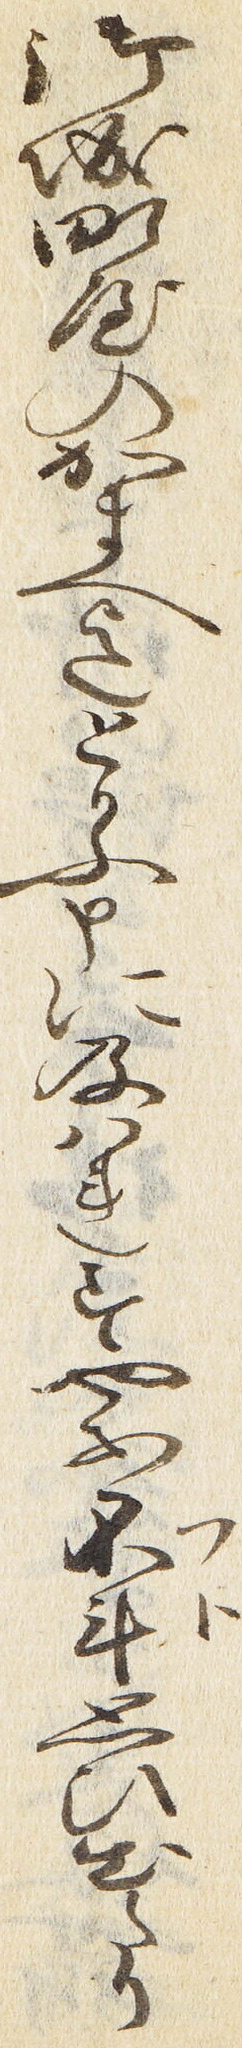御城町屋のかまへ迄とかふ申に及はれすやあ不斗思ひ出たり
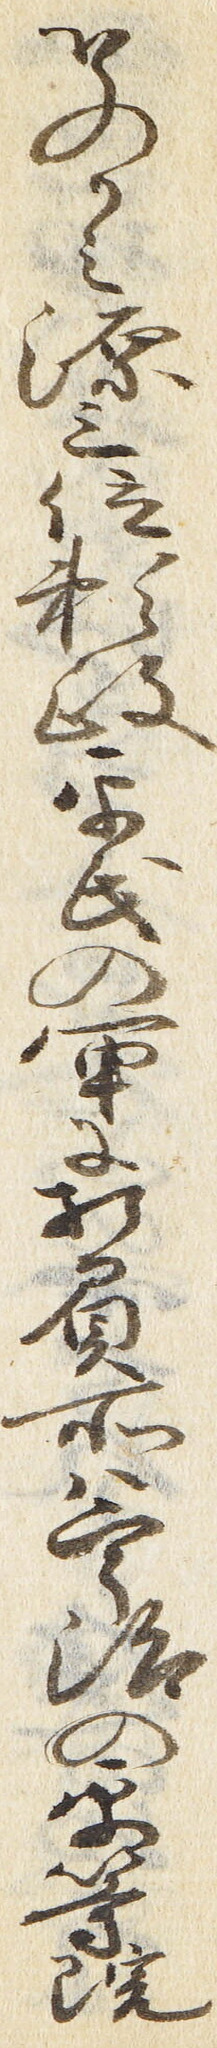そのかみ源三位頼政平氏の軍に打負所は宇治の平等院
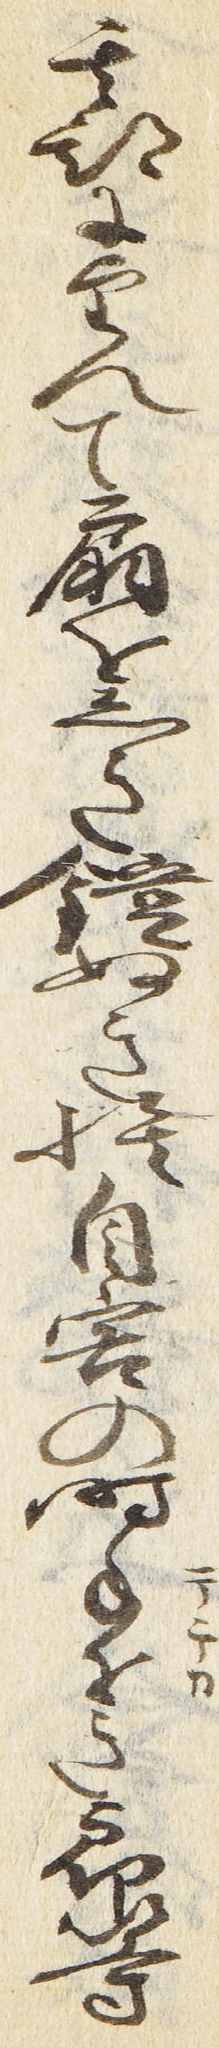其期に望んて扇をしき鎧ぬき捨自害の時手近き郎等
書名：海陸世話日記
